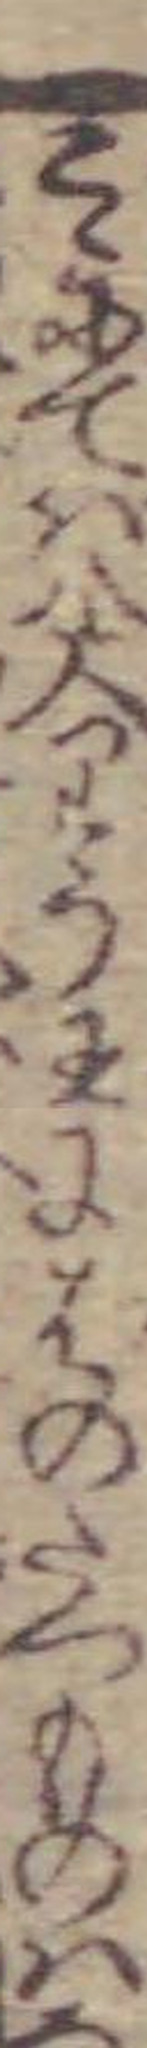こゝにては八大りう王にはのたつものはなし
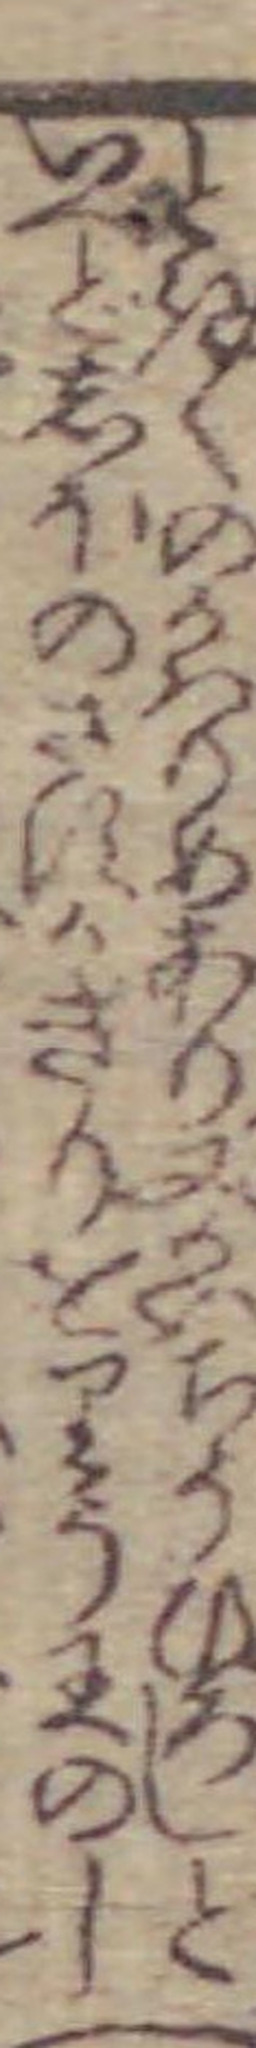いへどしほのさすかぎりをりう王のし
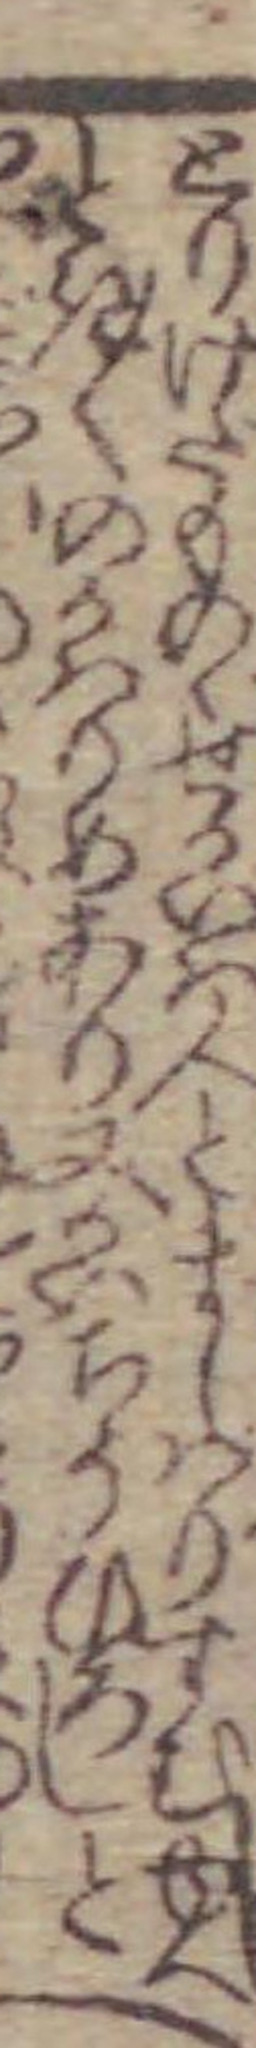とき〳〵のかはりめあり又かいちうひろしと
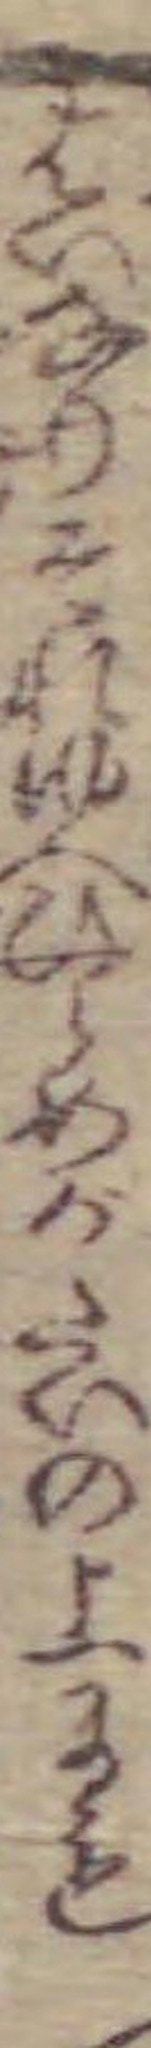はいなりそれゆへひらめがたいの上にも
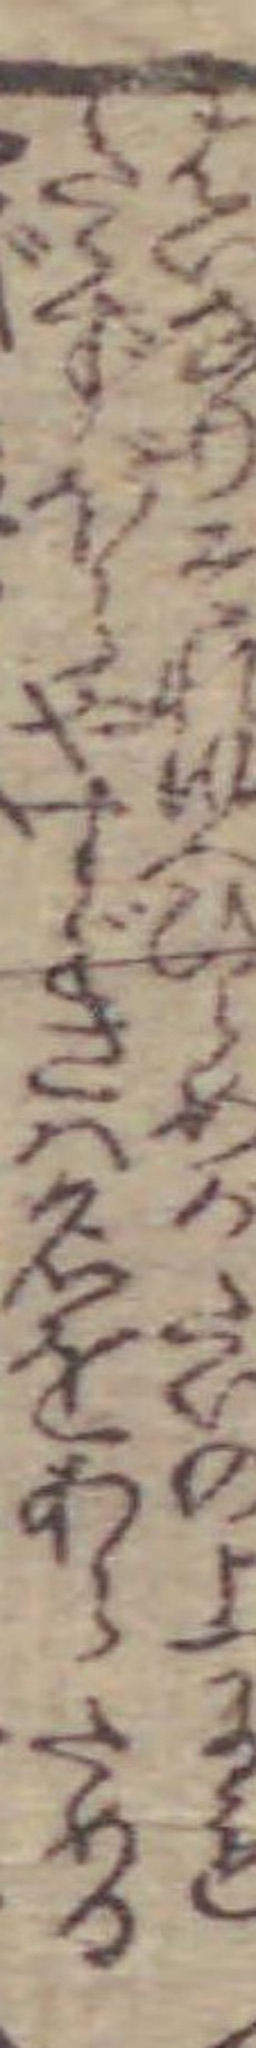たゝずぼらやすゞきは名をあらためる
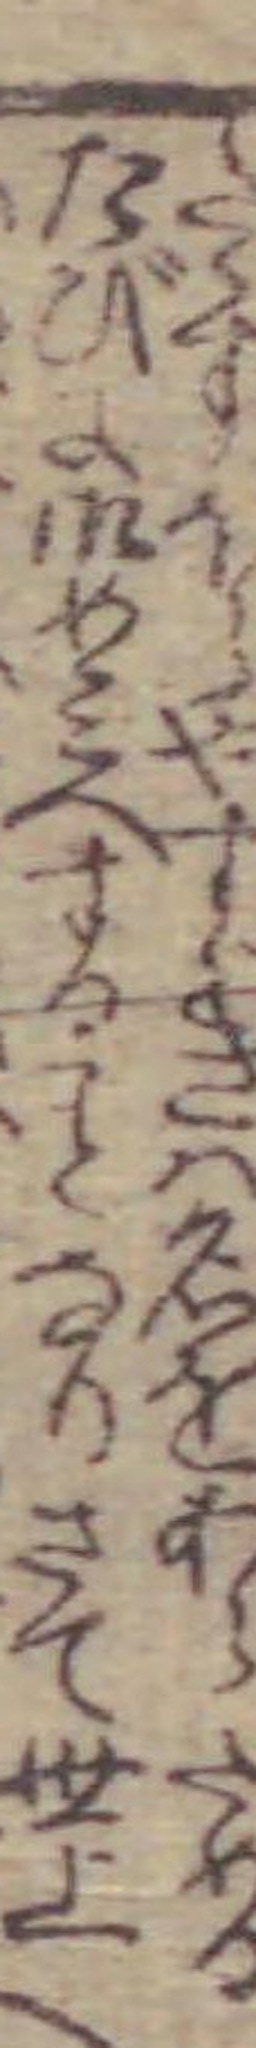たびに御めみへすることなりさて世上
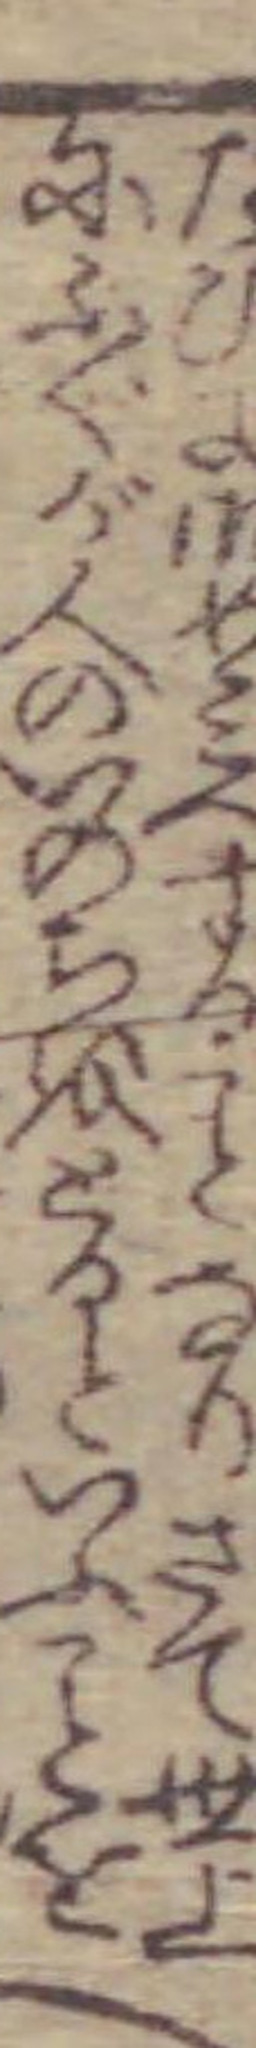にふぐが人のいのちをとるといふことを
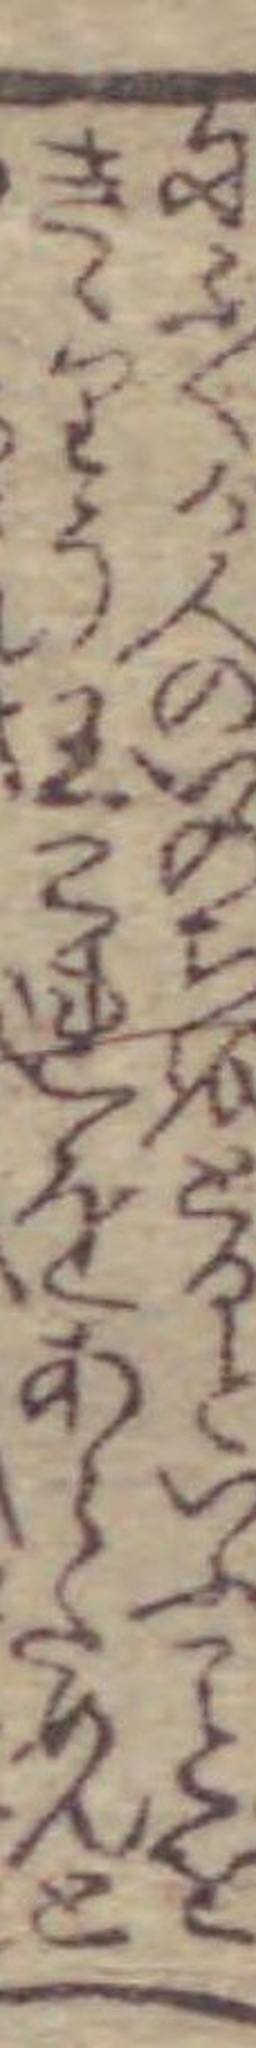きゝりう王これをあらためんと
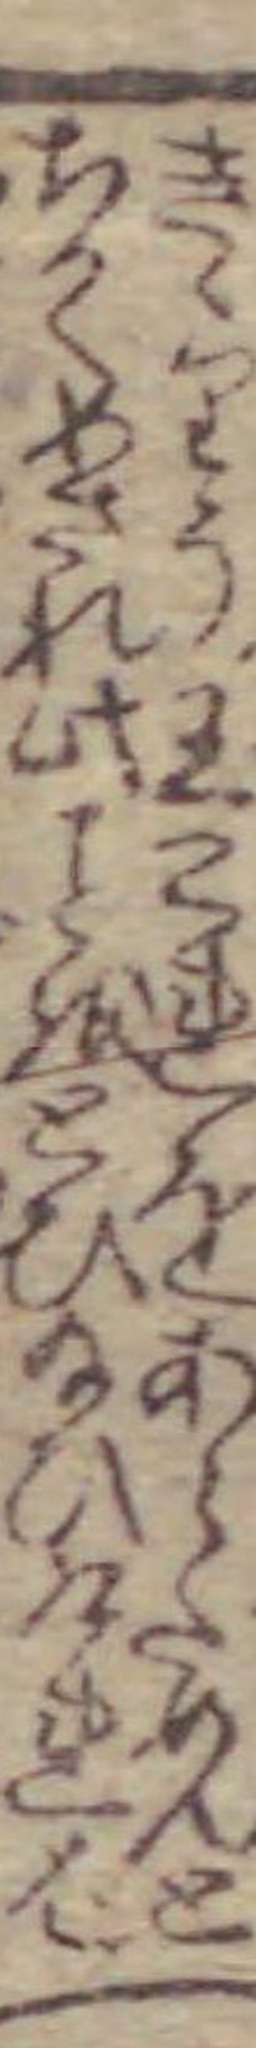ちかくめされ此ことをとひ給ひければ
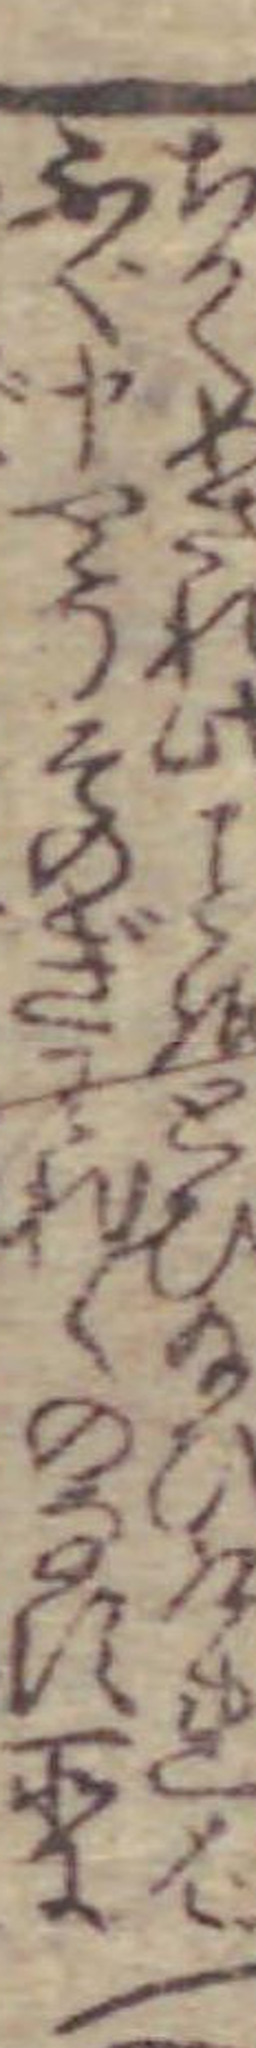ふぐ申やうそのぎわれ〳〵のなす所に
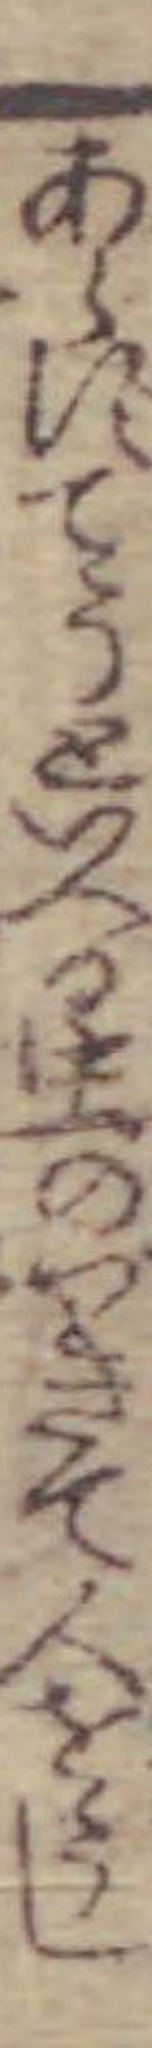あらずてうといへる虫のつきて人をうし
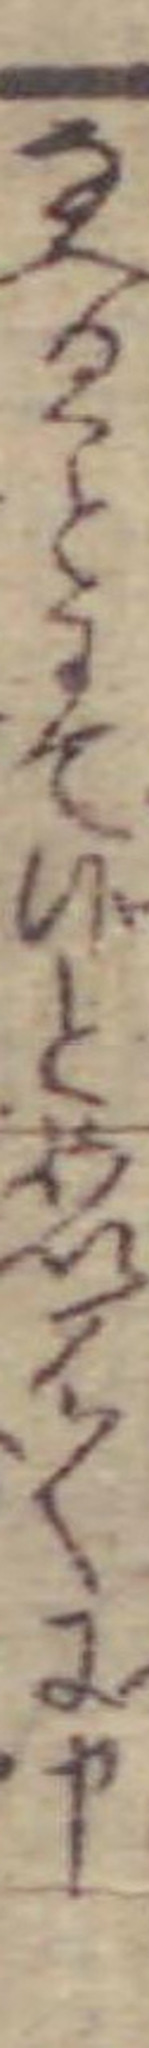なへることにて候とめいはくに申
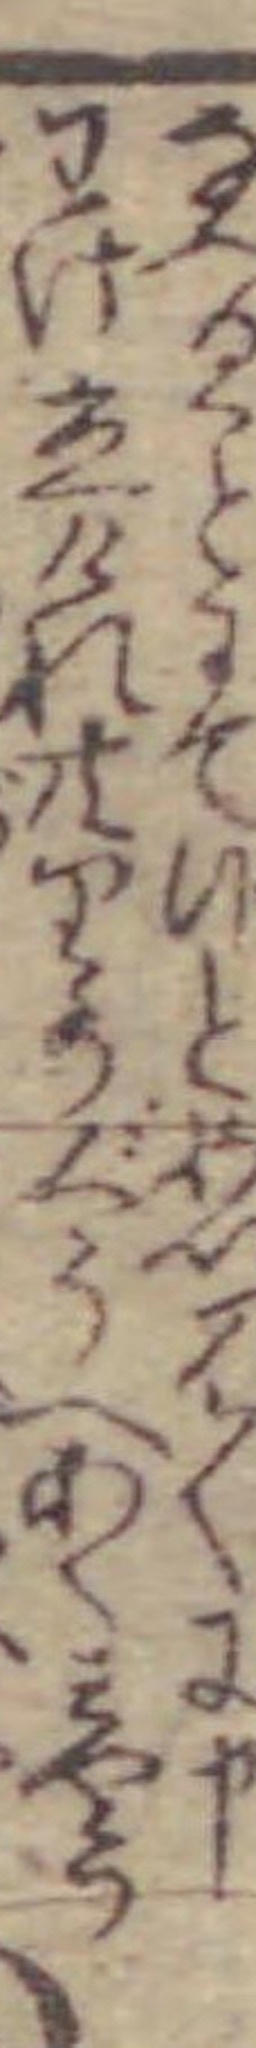わけ立けれ共ろうぐうへあくみやう
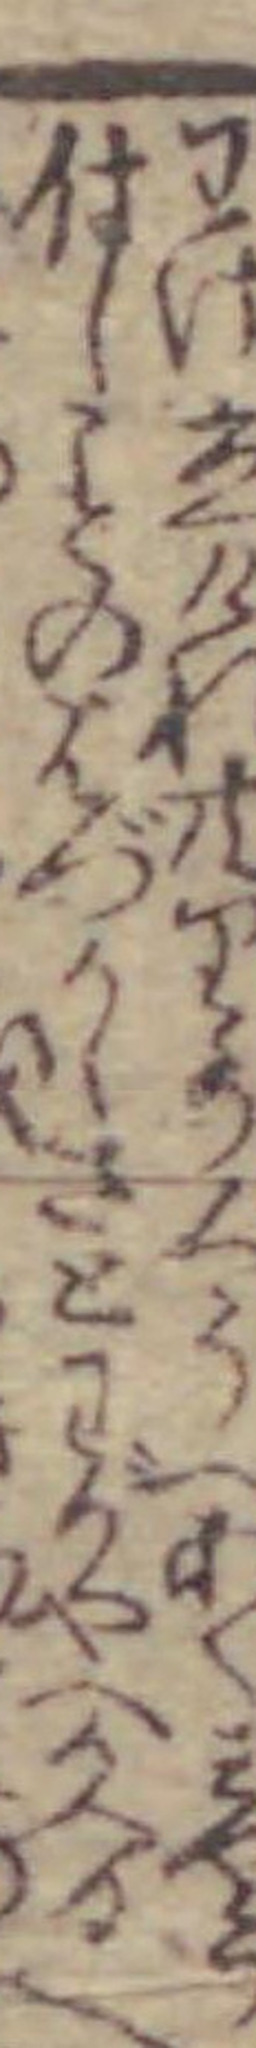付しことのはづかしさとわかやへかへる
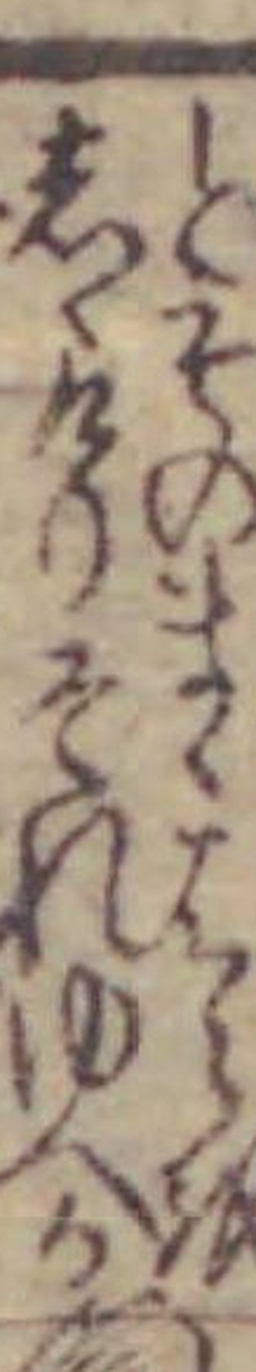しゝけりそれゆへか
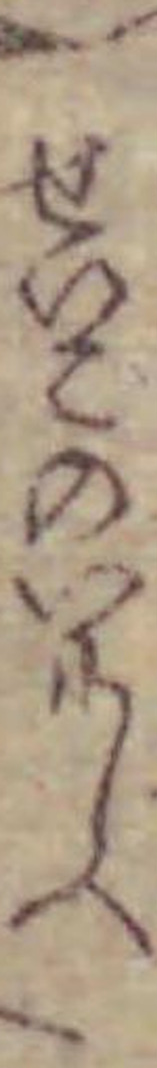せいこのいにしへ
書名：即席耳学問 : 3巻
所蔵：国立国会図書館 National Diet Library, JAPAN
